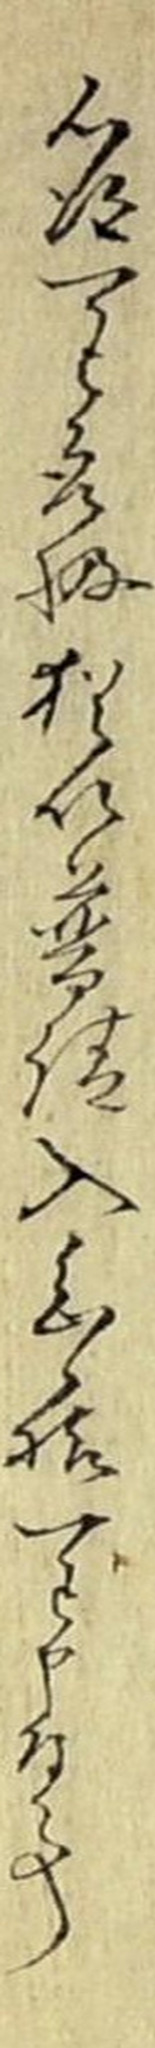心得可被取扱猶以普請入念候様可被申付事
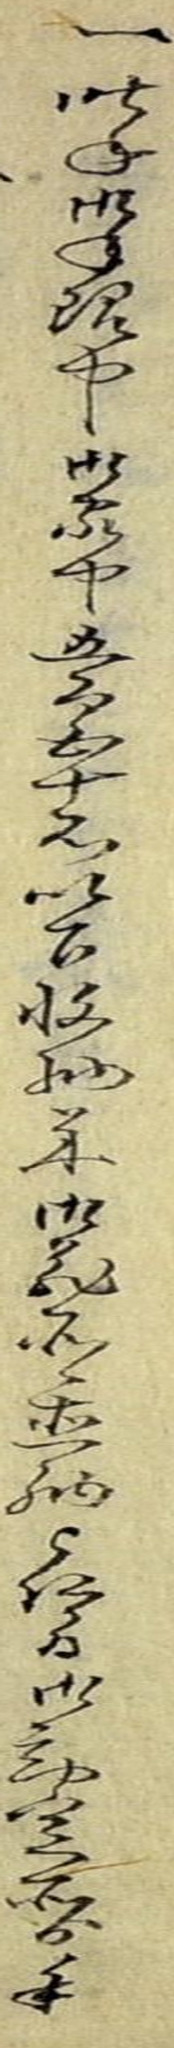一昨年御年限中御家中五百五十石以可収納米御蔵所へ直納被仰付御勘定所ゟ手
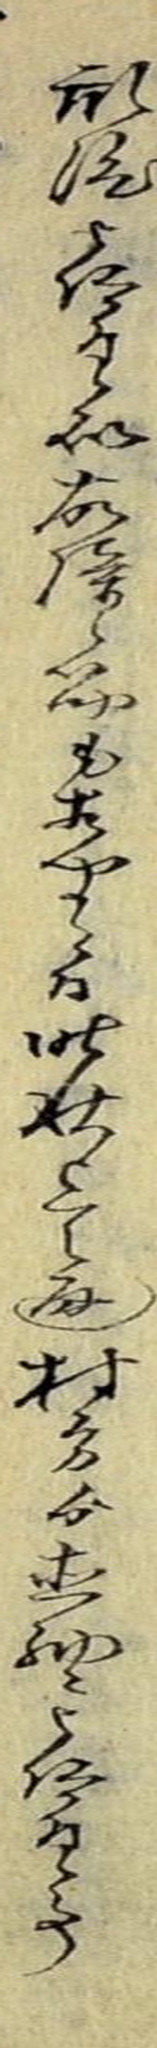形渡被仰付候処故障之筋も相聞候に付昨秋迄之通村方ゟ直納被仰付候事
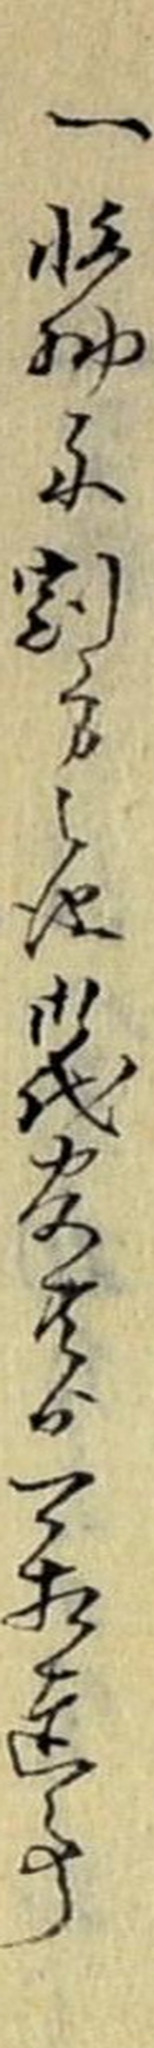一収納米割方之儀御代官共ゟ可相達事
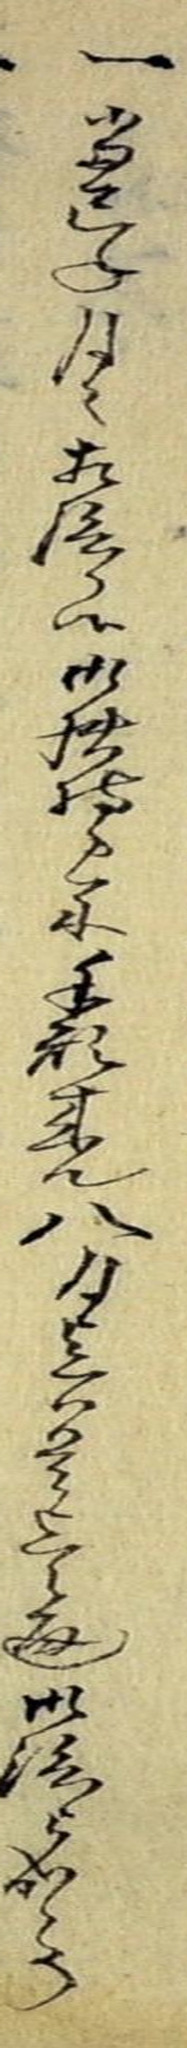一当巳年月々相渡り候御扶持方米手形来ル八月迄は是迄之通御渡被成候事
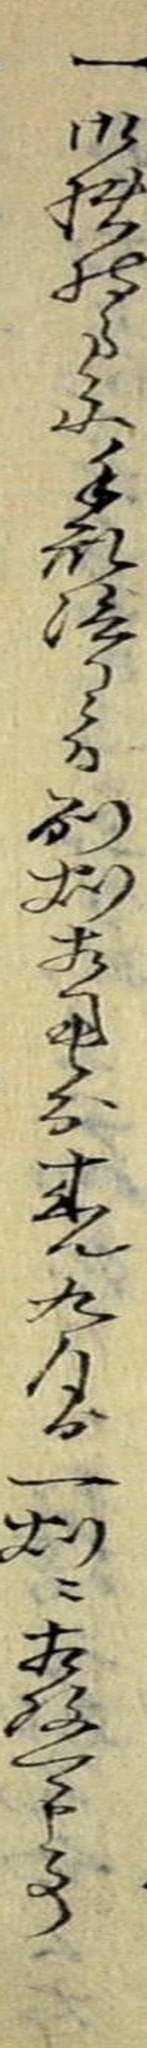一御扶持方米手形渡りに付別判相用候分来ル九月ゟ一判に相改可申事
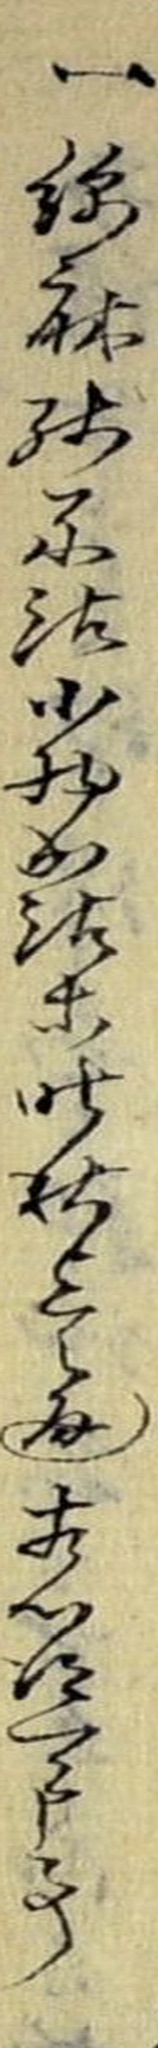一綿麻紗米銀小物成銀等昨年迄之通相心得可申事
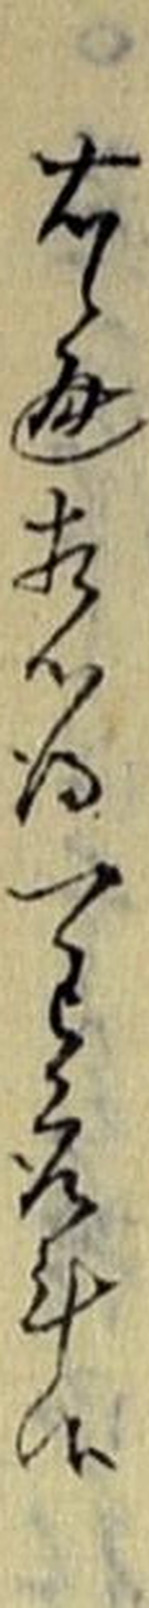右之通相心得可被取斗候
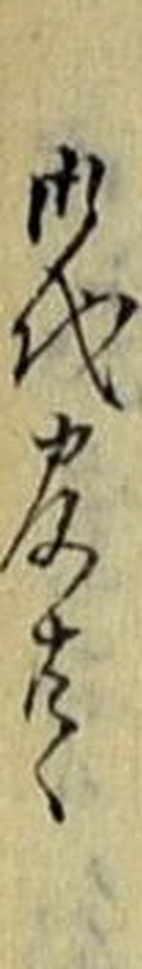御代官共へ
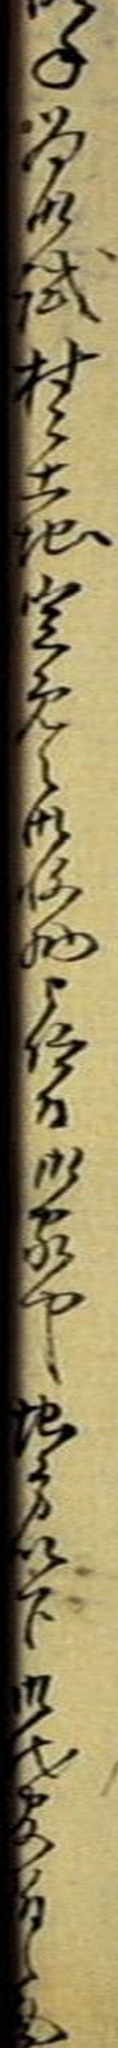一昨年為御試村々土地定免之御収納被仰付御家中地方以可御代官附之面々収
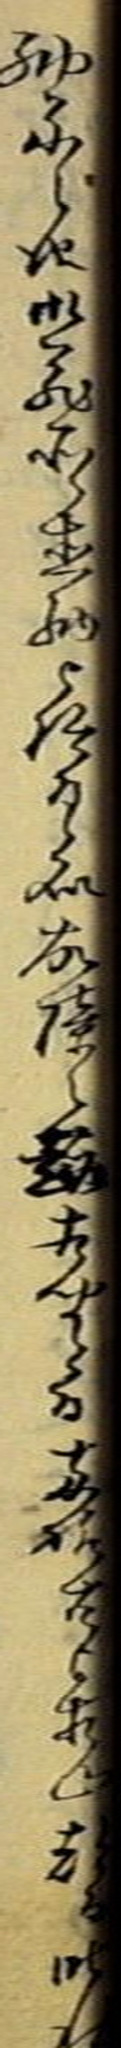納米之儀御蔵所へ直納被仰付候処故障之趣相聞候に付両様共被相止都而昨秋
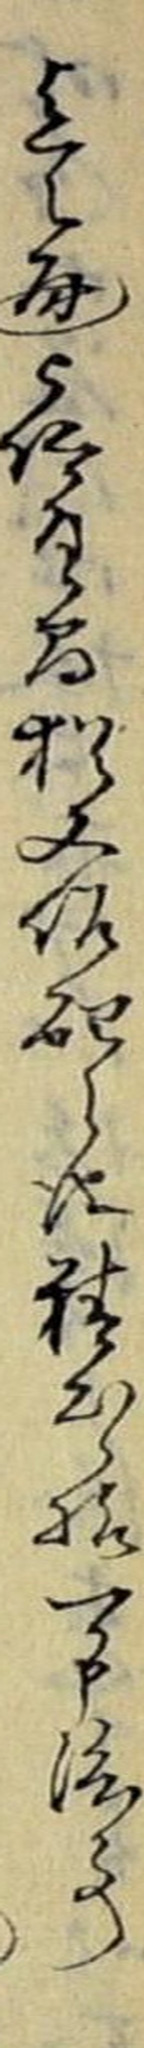迄之通被仰付候間猶又作配之儀精出候様可申渡事
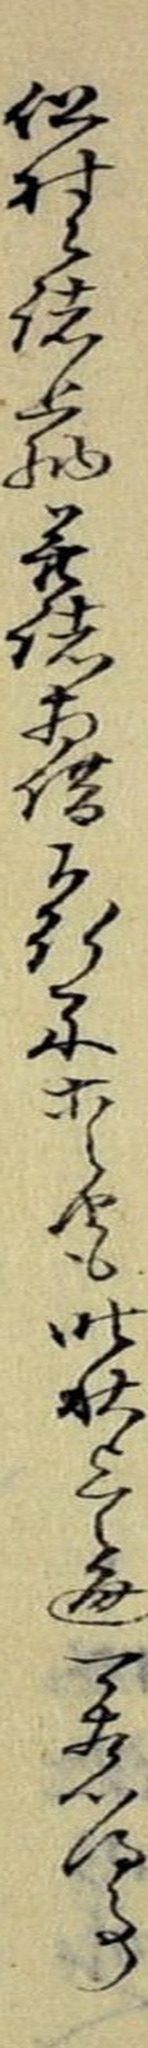但村々諸上納并諸拝借下行米等之儀も昨秋迄之通可相心得事
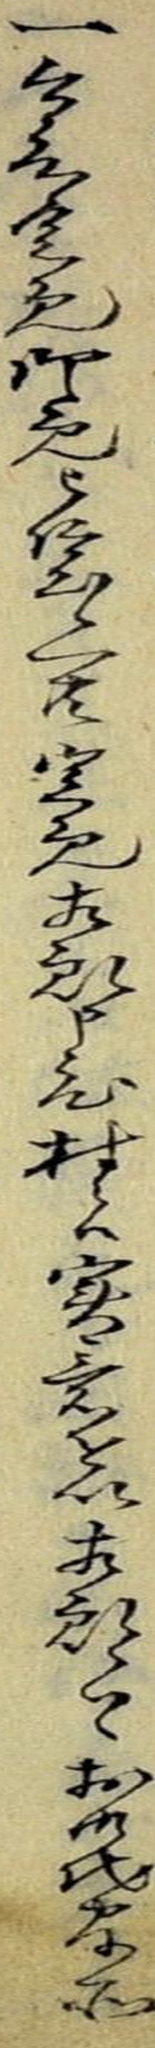一今度定免御免被仰出候へ共定免相願申度村は実意を以相願候はヽ於御代官所
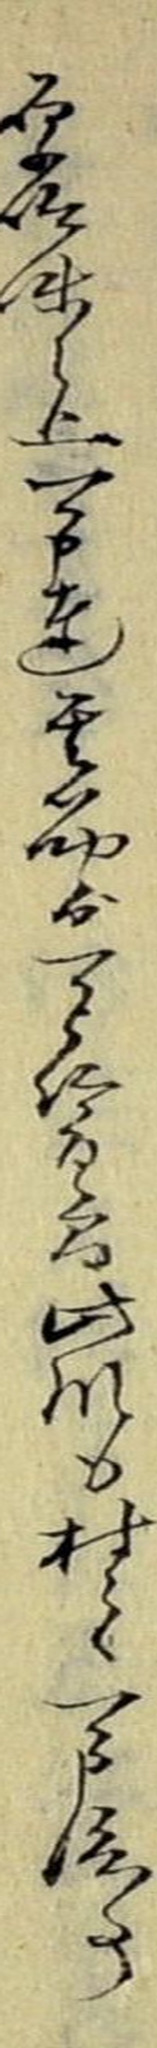厚吟味之上可申達其筋ゟ可被仰付候間此段も村々へ可申渡事
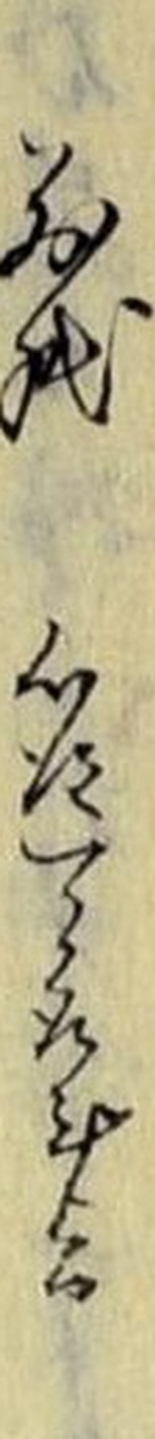別紙心得可取斗旨
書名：命令之部 六
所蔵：福井県文書館 Fukui Prefectural Archives
